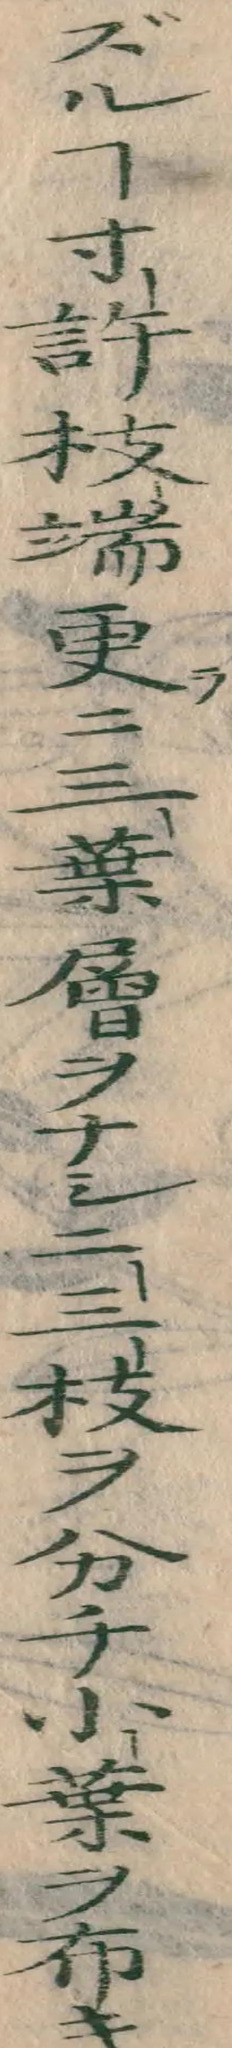ズルコト寸-許枝-端更ニ三-葉層ヲナシ二-三-枝ヲ分チ小-葉ヲ布キ
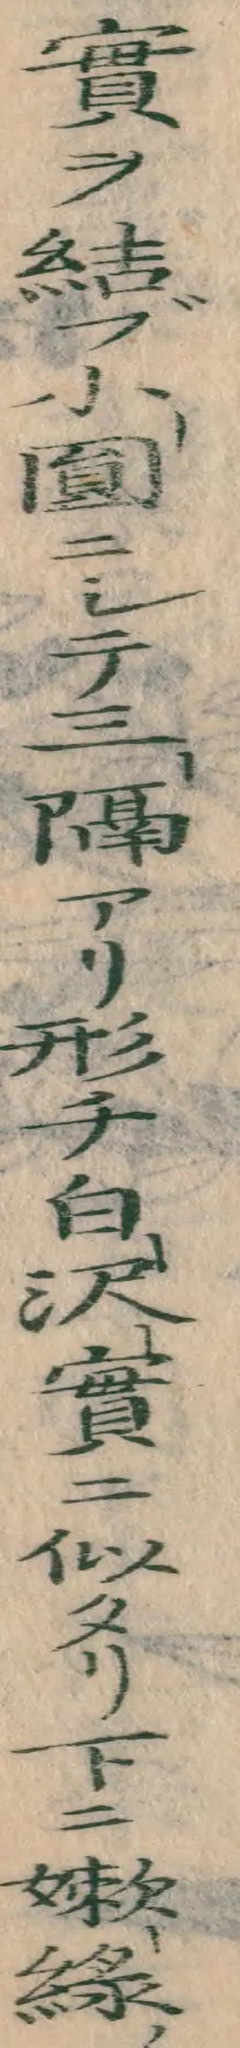実ヲ結ブ小-円ニシテ三-隔アリ形チ白-沢-実ニ似タリ下ニ嫩-緑
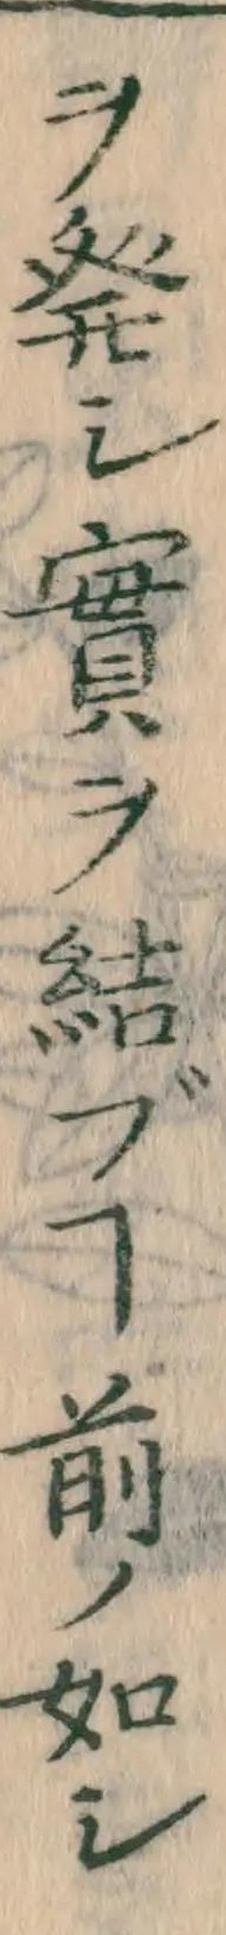ヲ発シ実ヲ結ブコト前ノ如シ
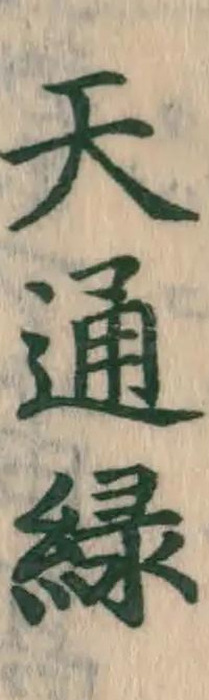天通緑

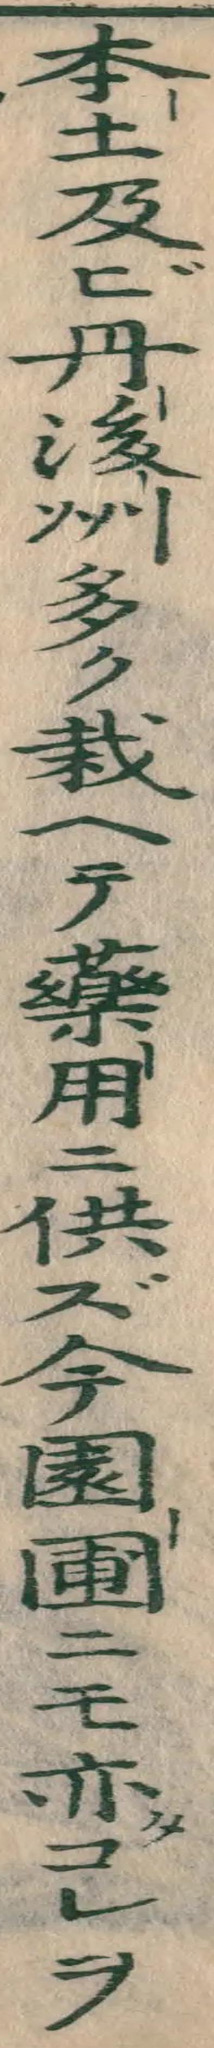本-土及ビ丹-後-州多ク栽ヘテ薬-用ニ供ズ今園-圃ニモ亦コレヲ
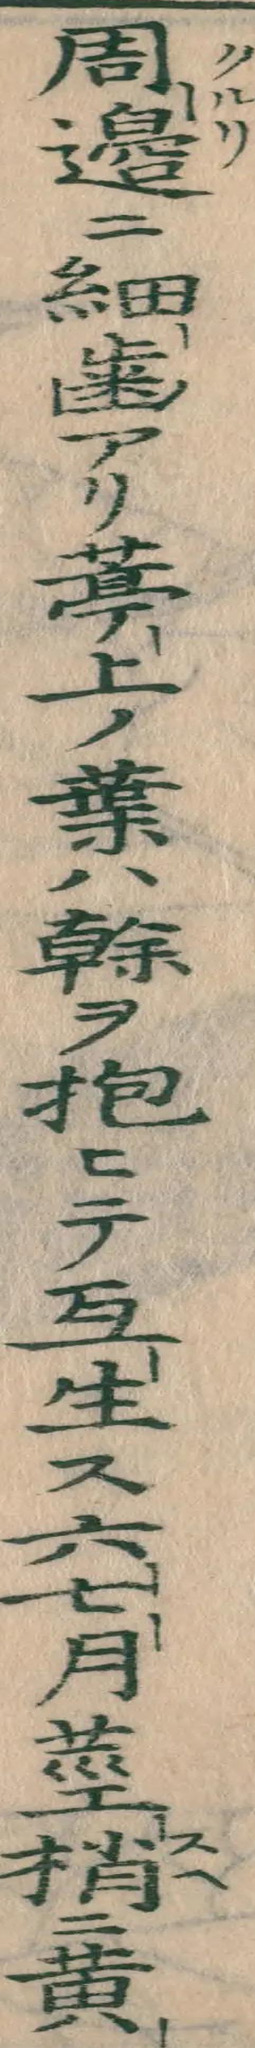周-辺グルリニ細-歯アリ葶-上ノ葉ハ幹ヲ抱ヒテ互-生ス六-七-月茎-梢ニ黄-
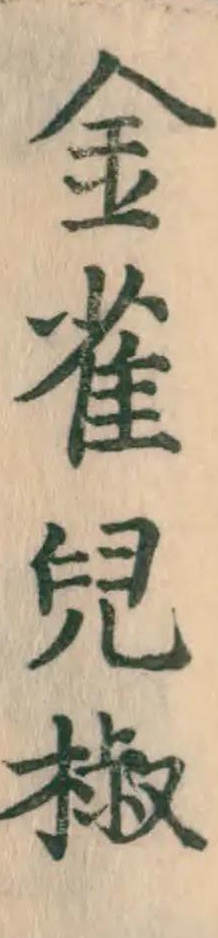金雀児椒

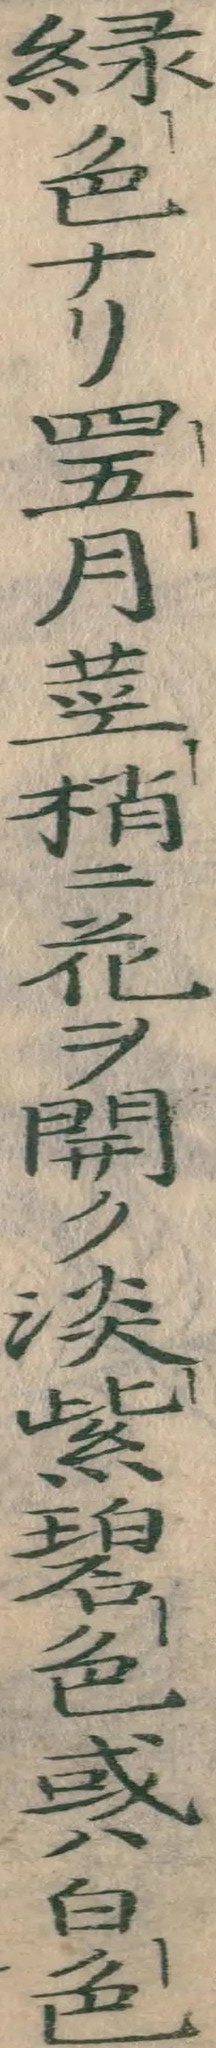緑-色ナリ四-五-月茎-梢ニ花ヲ開ク淡-紫碧-色或ハ白-色
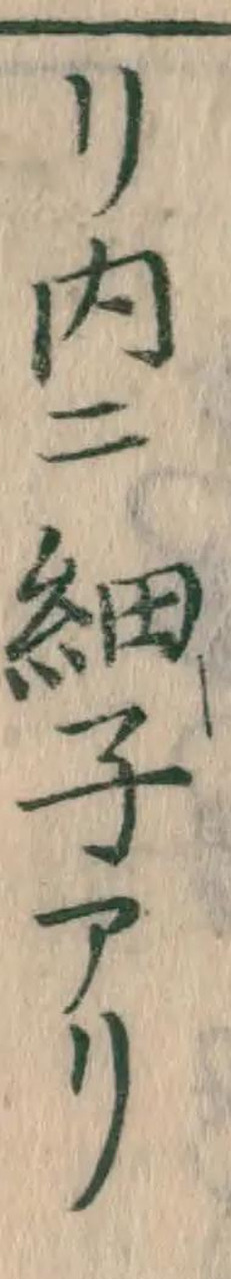リ内ニ細-子アリ
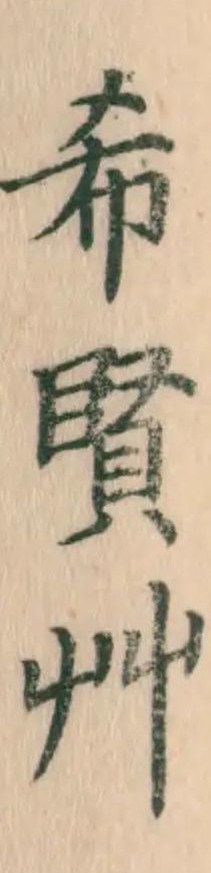希賢艸

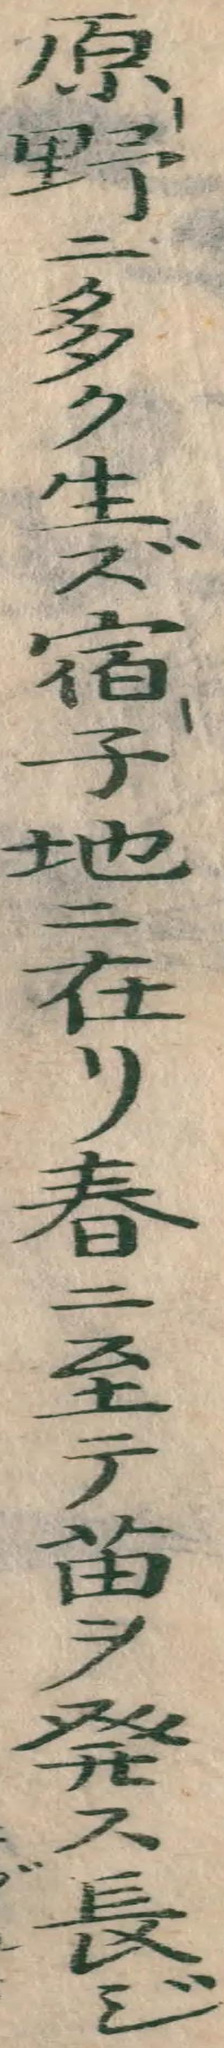原-野ニ多ク生ズ宿-子地ニ在リ春ニ至テ苗ヲ発ス長ジ
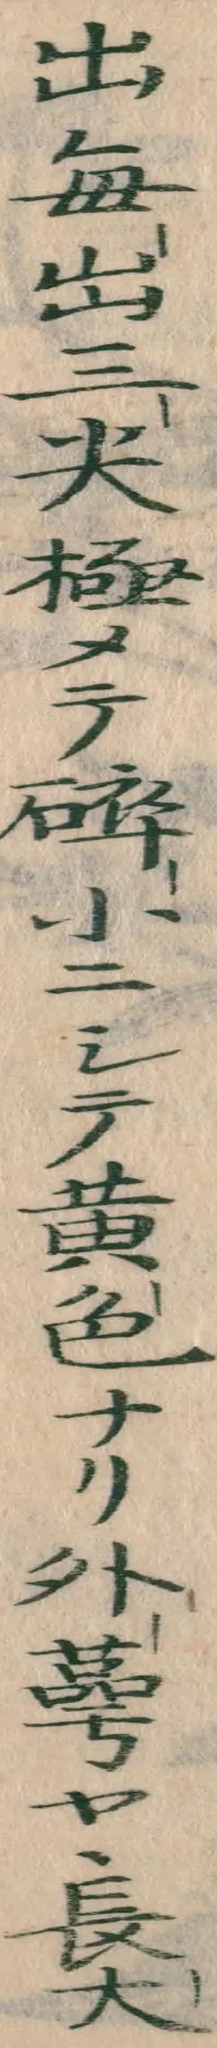出毎-出三-尖極メテ砕-小ニシテ黄-色ナリ外-萼ヤヽ長-大
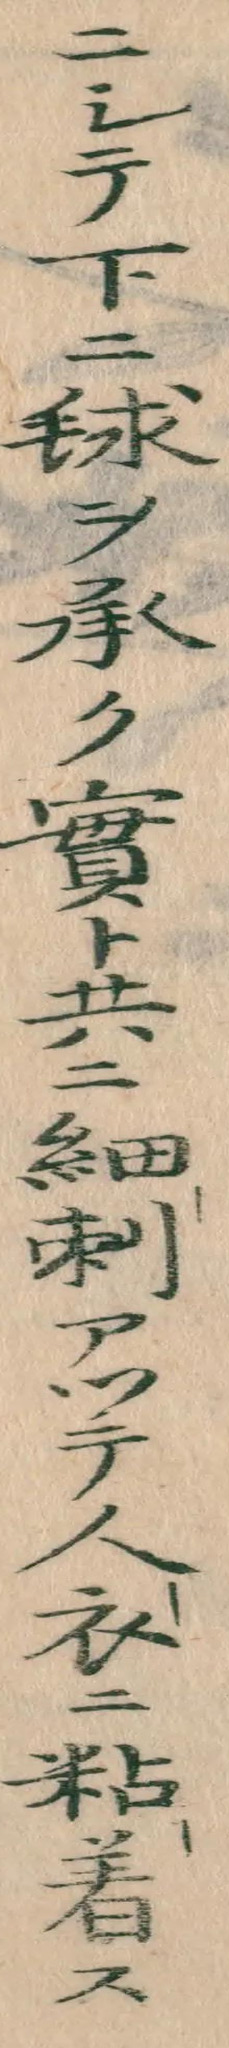ニシテ下ニ毬ヲ承ク実ト共ニ細-刺アツテ人-衣ニ粘-着ス
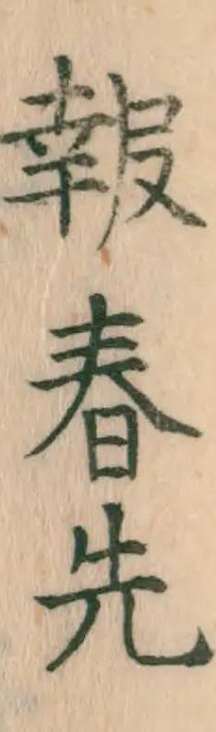報春先

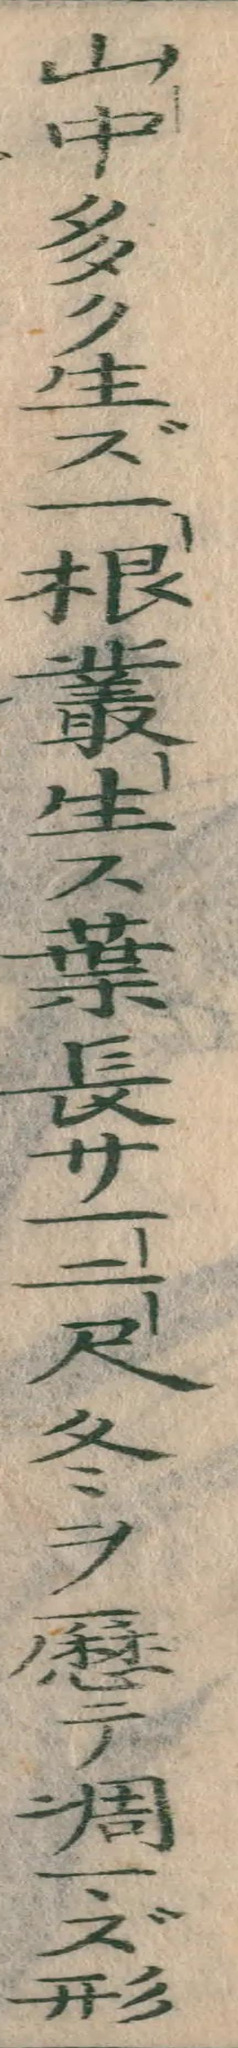山-中多ク生ズ一-根叢-生ス葉長サ一-二-尺冬ヲ歴テ凋マズ形
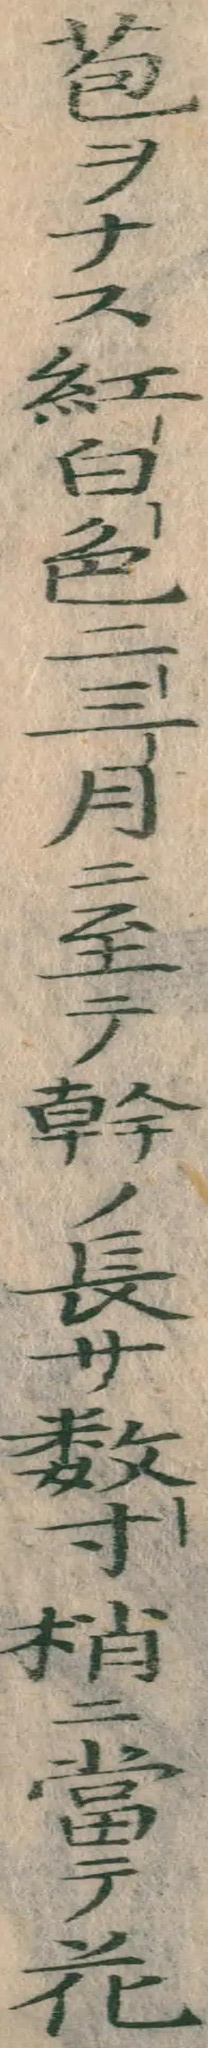苞ヲナス紅-白-色二-三-月ニ至テ幹ノ長サ数-寸梢ニ当テ花
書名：花彙 草部4巻木部4巻. [1]
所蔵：国立国会図書館 National Diet Library, JAPAN
